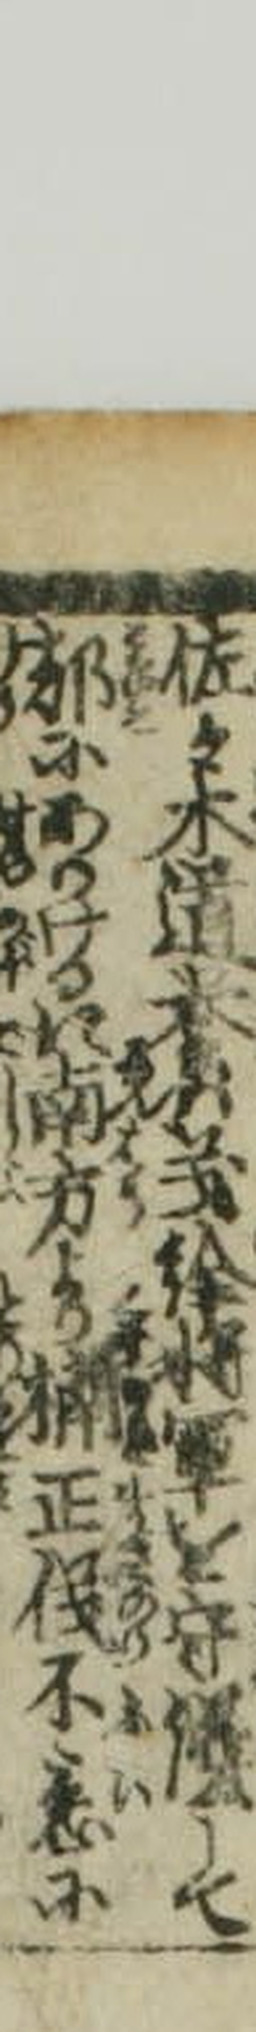都にありけるに南方より楠正儀不意に
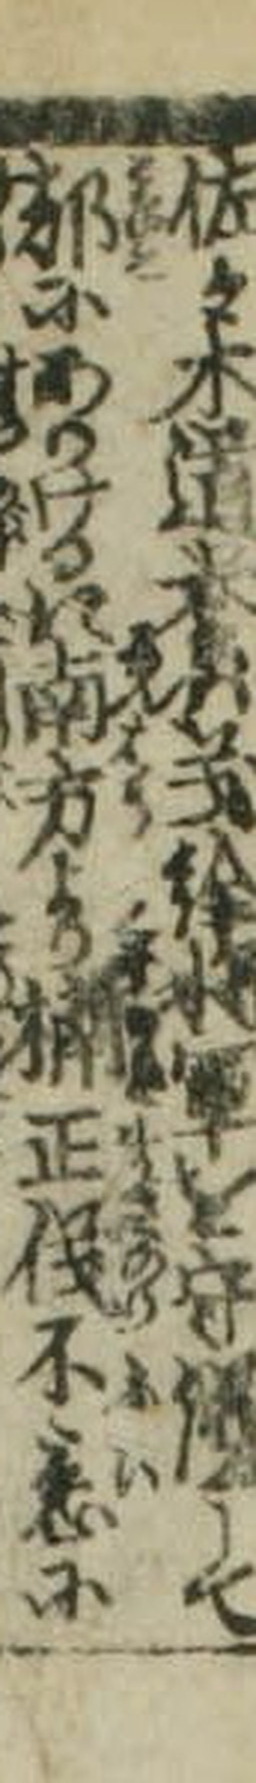都にありけるに南方より楠正儀不意に
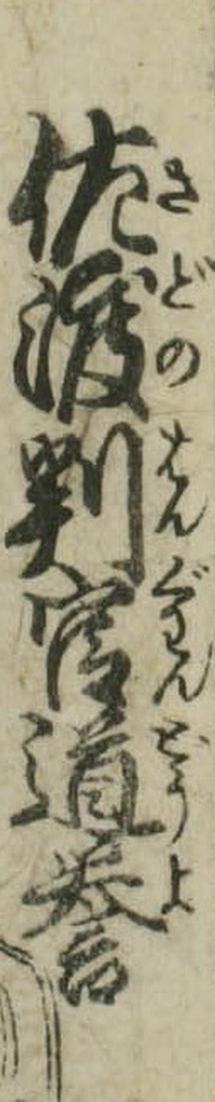佐渡判官道誉
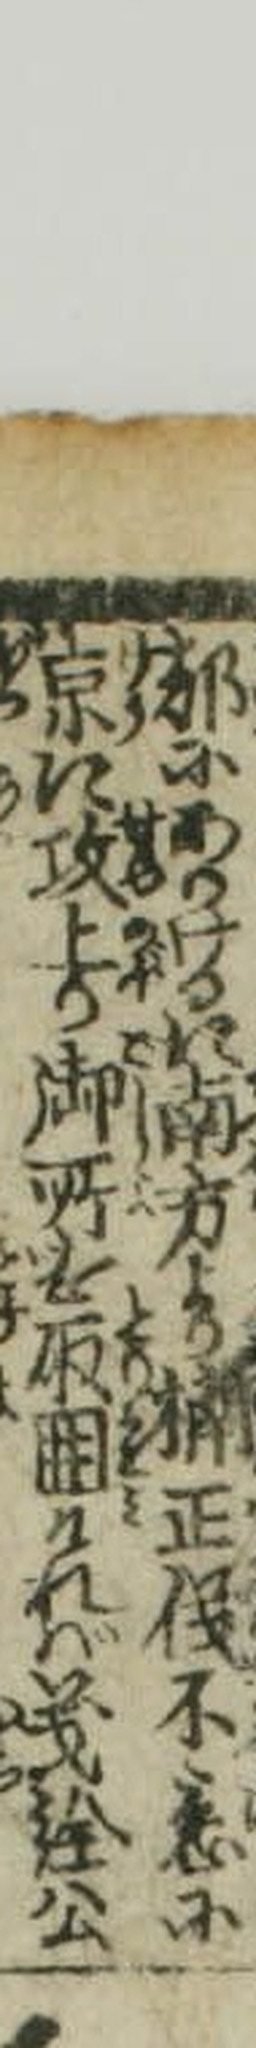京に攻上り御所を取囲ければ義詮公
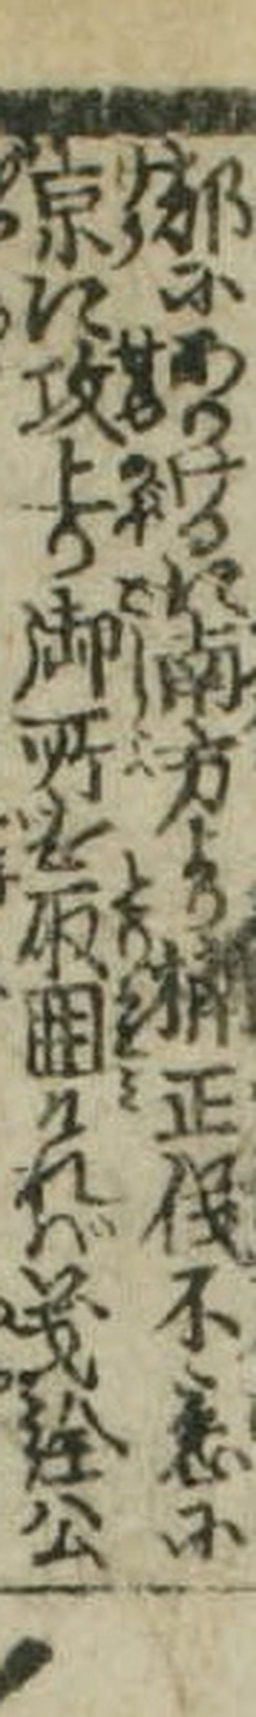京に攻上り御所を取囲ければ義詮公
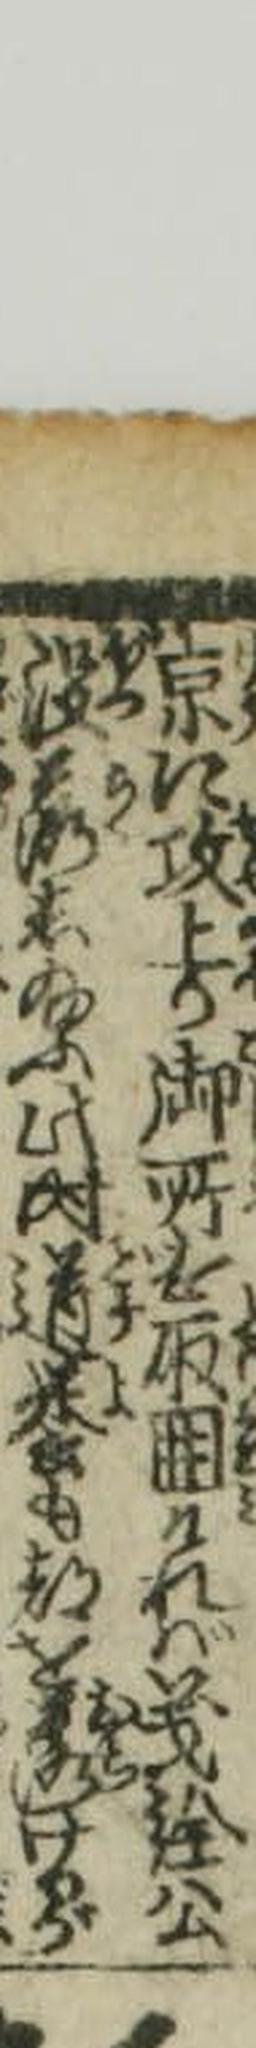没落し給ふ此時道誉も都を落けるが
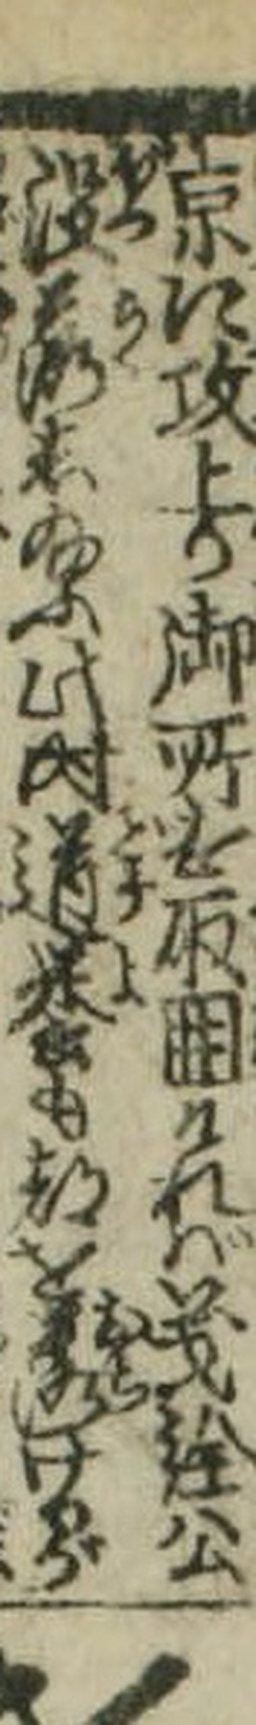没落し給ふ此時道誉も都を落けるが
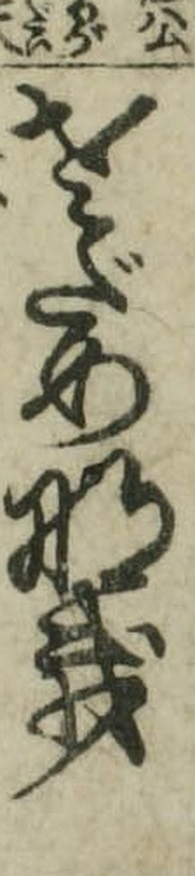さだめなき
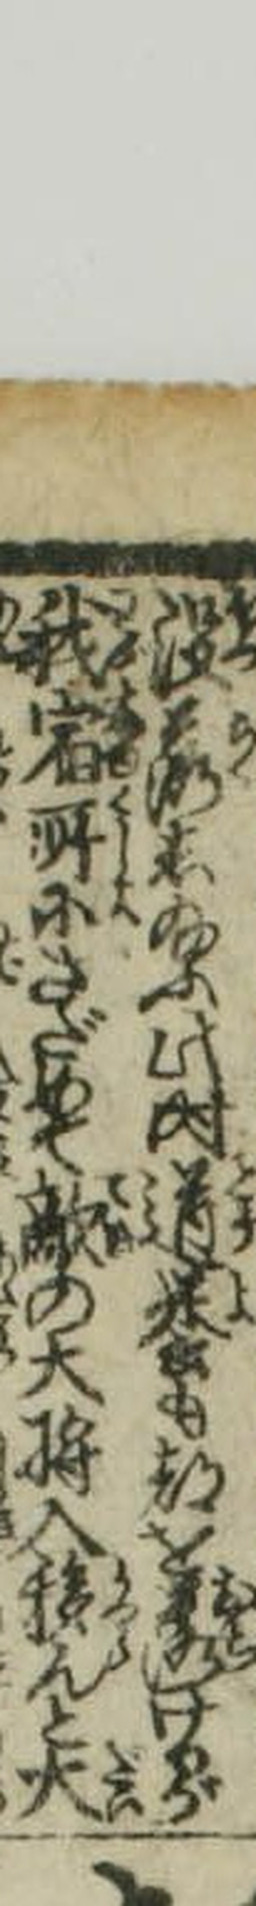我宿所にさだめて敵の大将入移んと大
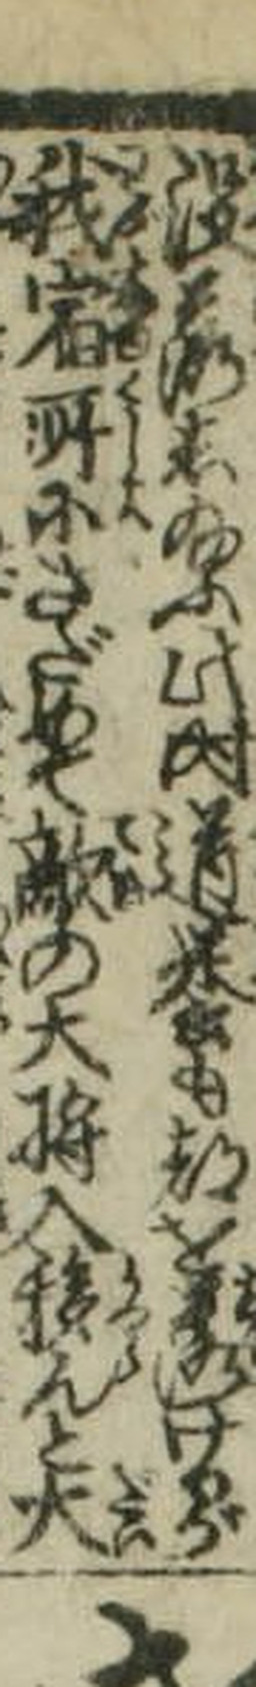我宿所にさだめて敵の大将入移んと大
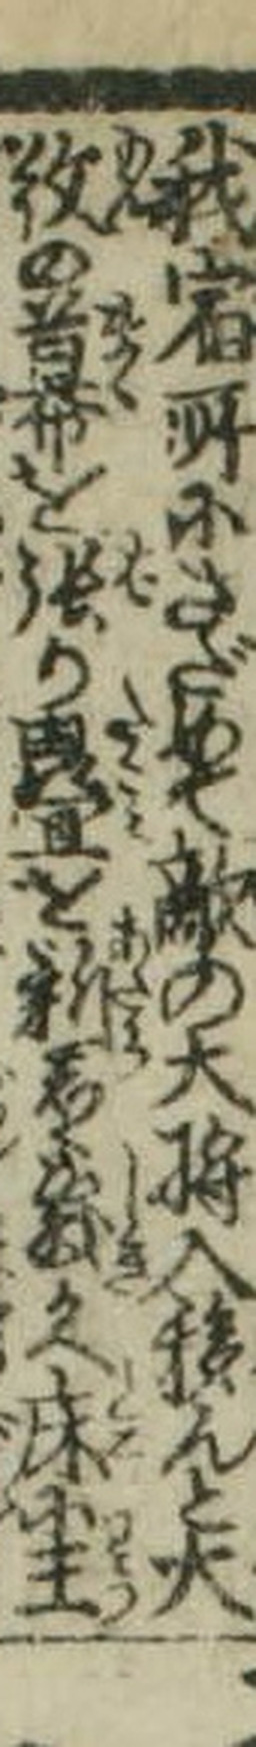紋の幕を張り畳を新しく敷かへ床に王
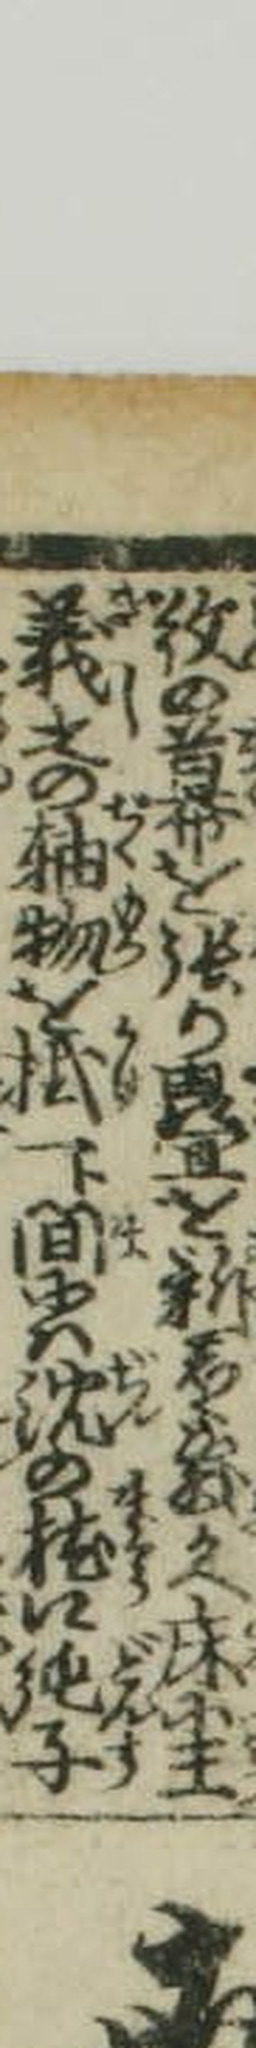義之の軸物を掛一ㇳ間には沈の枕に純子
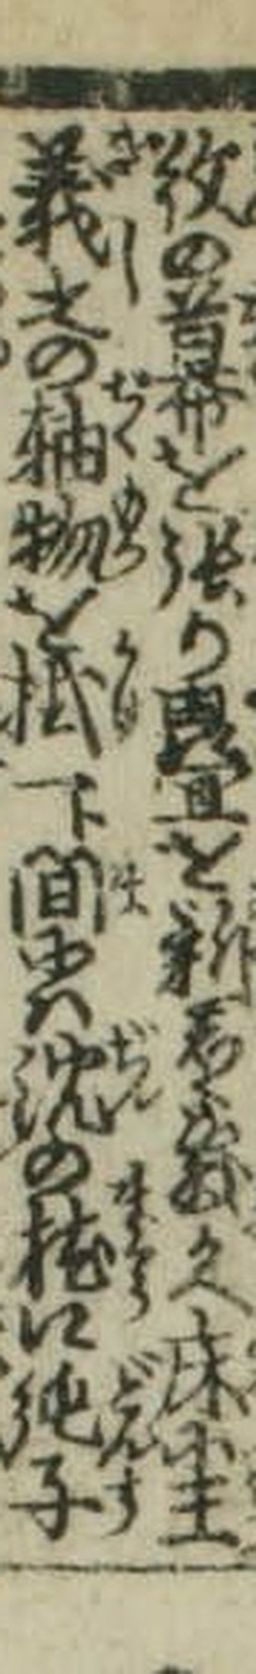義之の軸物を掛一ㇳ間には沈の枕に純子
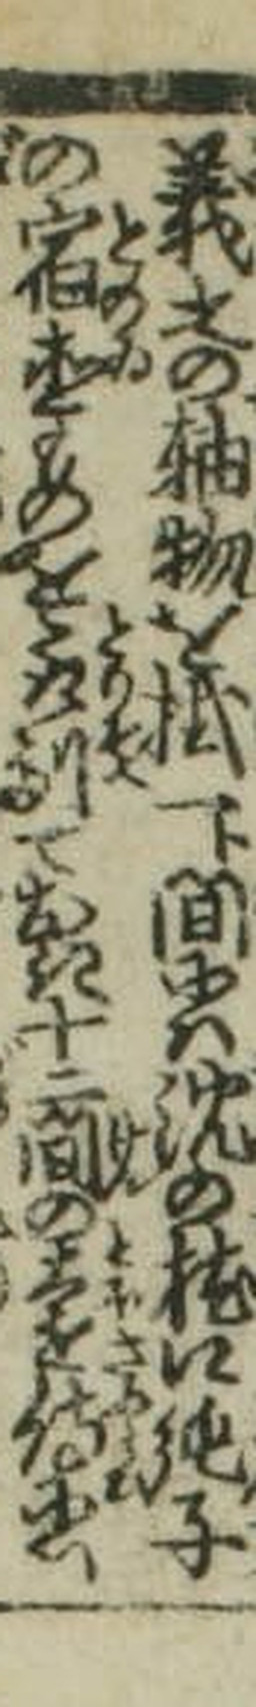の宿直ものを取副ておき十二間の遠侍には
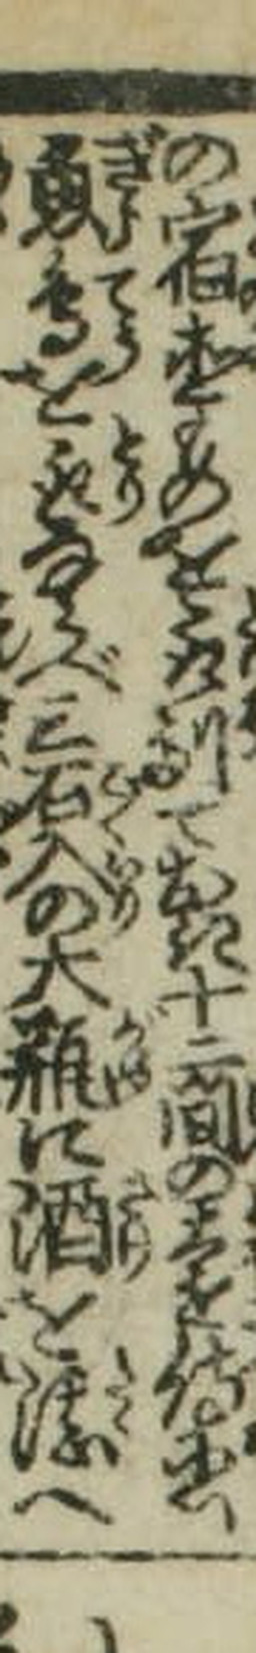魚鳥を取ならべ三石入の大瓶に酒を湛へ
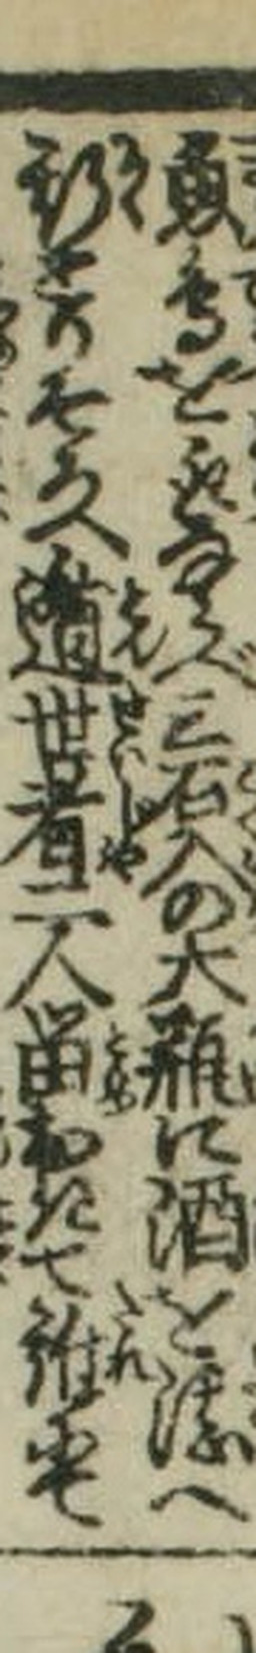斯とりそろへ遁世者二人留おきて誰にて
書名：續英雄百人一首
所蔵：東京学芸大学附属図書館
